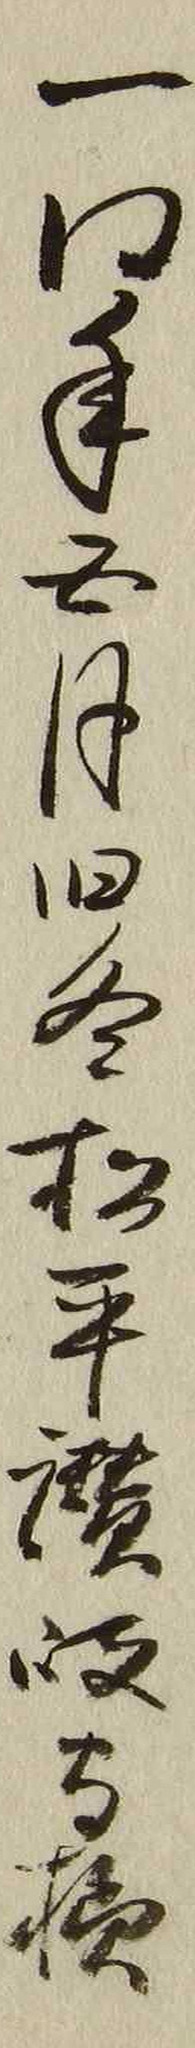一同年五月旧冬松平讃岐守様
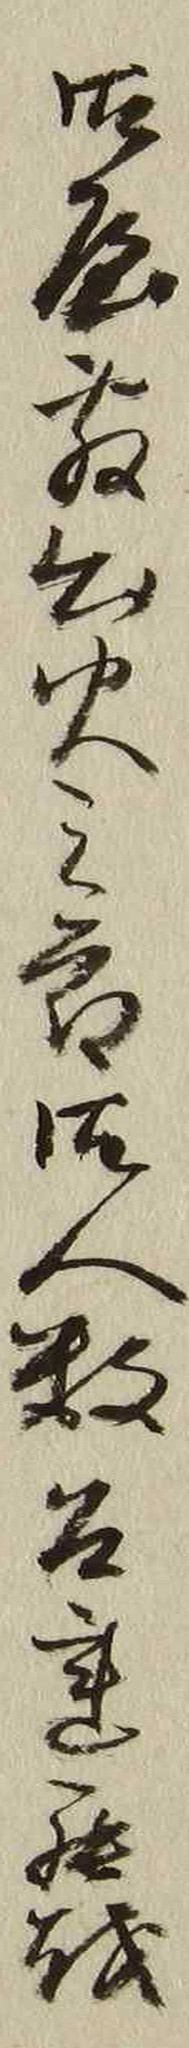御屋敷出火之節御人数召連罷越
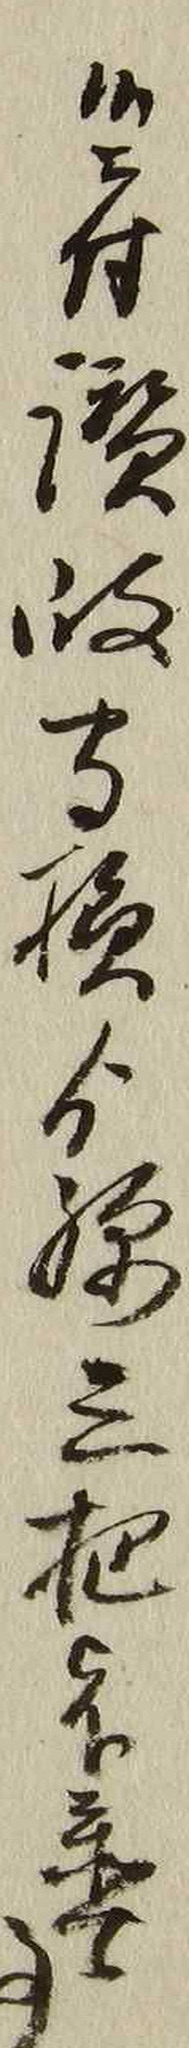候ニ付讃波守様ゟ綿三把被下置候事
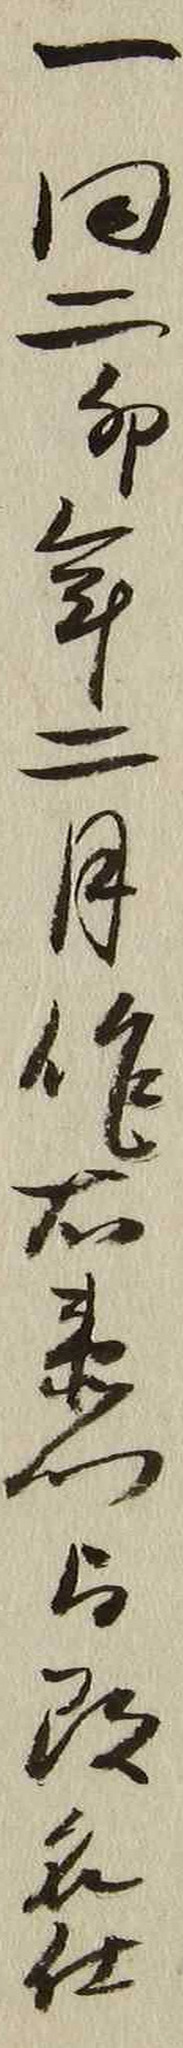一同二卯年二月作右衛門与改名仕
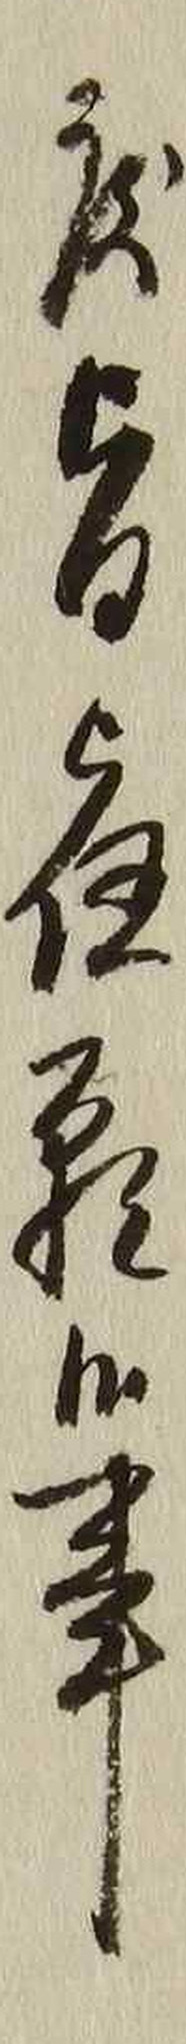度旨被任願候事
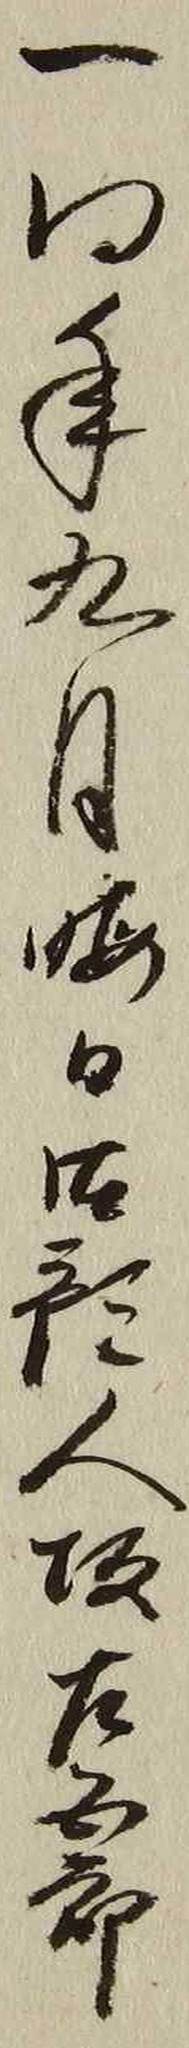一同年九月晦日御預人坂左五郎
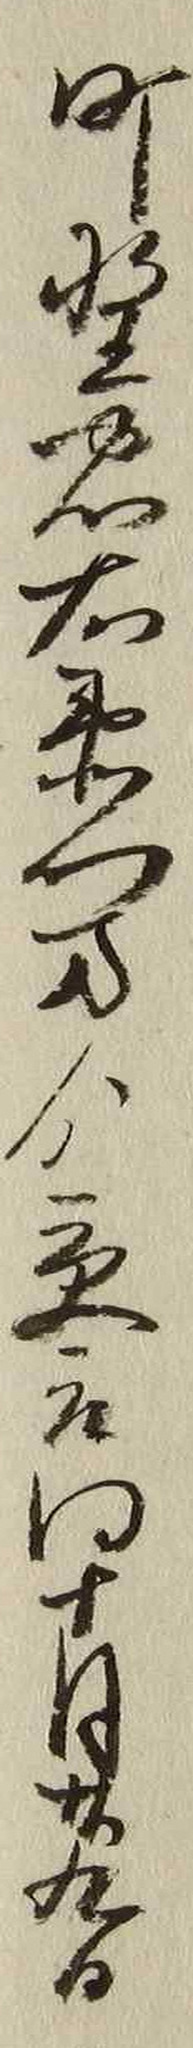町野忠右衛門方ゟ受取同十月廿九日
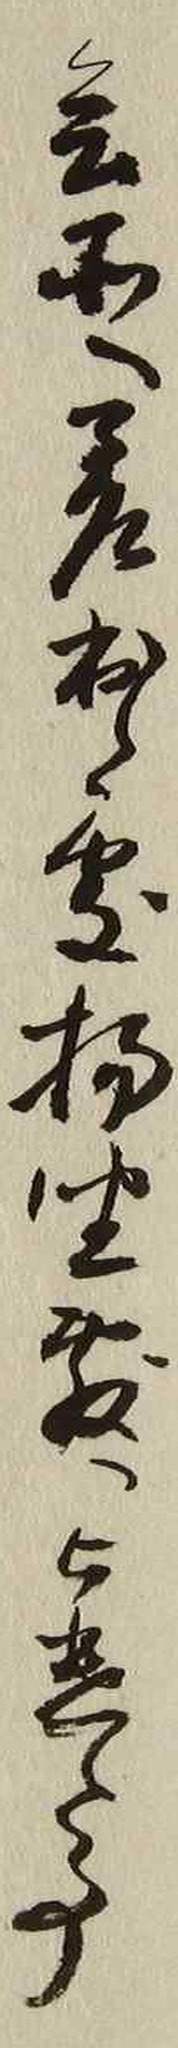会所へ差出候処揚坐敷へ被遣候事
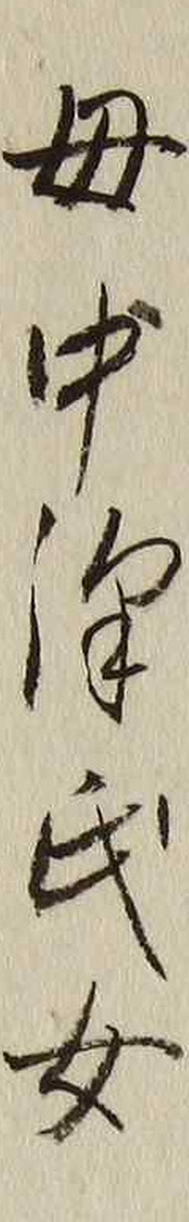母中沢氏女
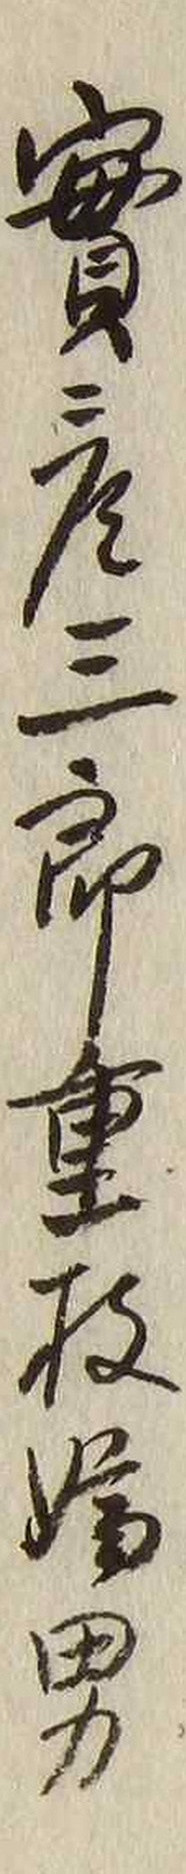実彦三郎重枝嫡男

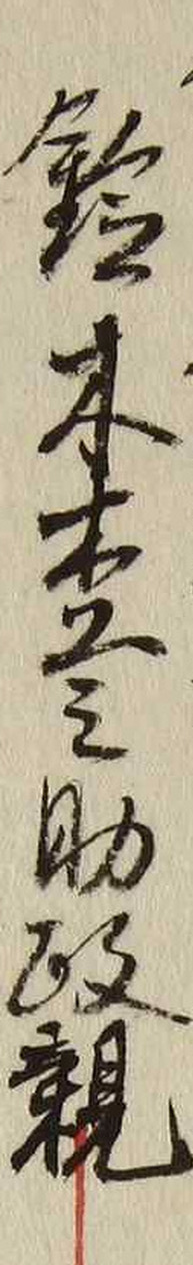鈴木杢之助政親
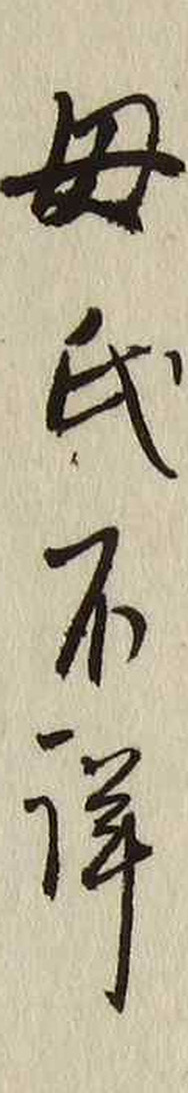母氏不詳
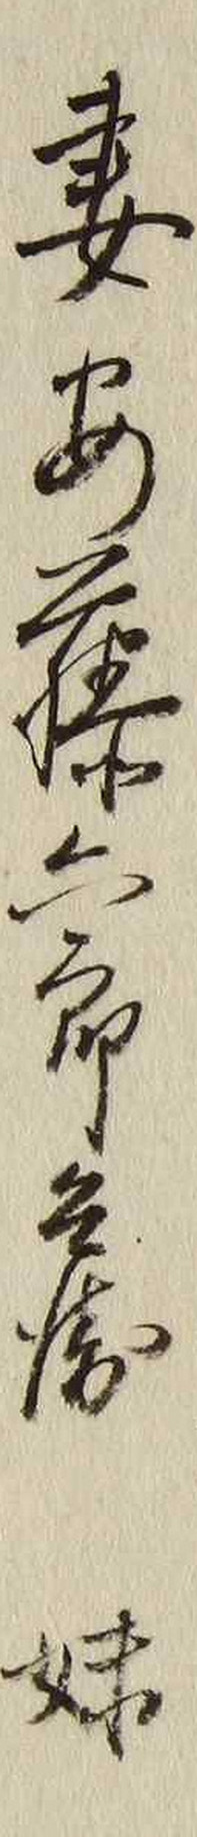妻安藤節六郎兵衛妹
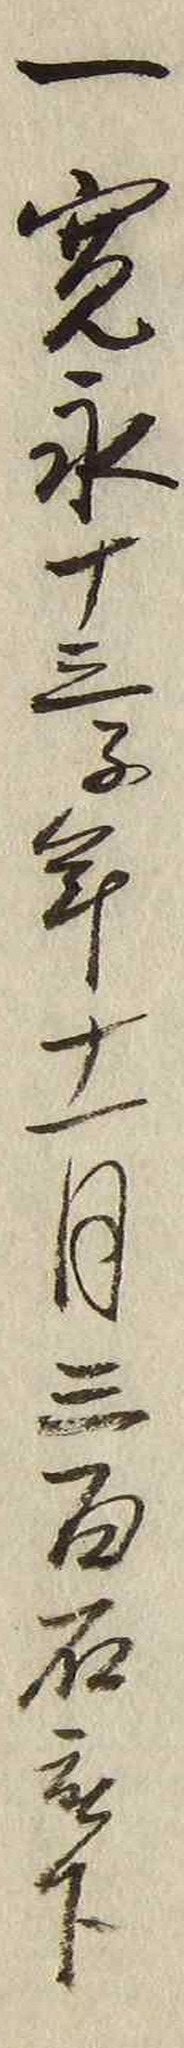一寛永十三子年十一月三百石被下

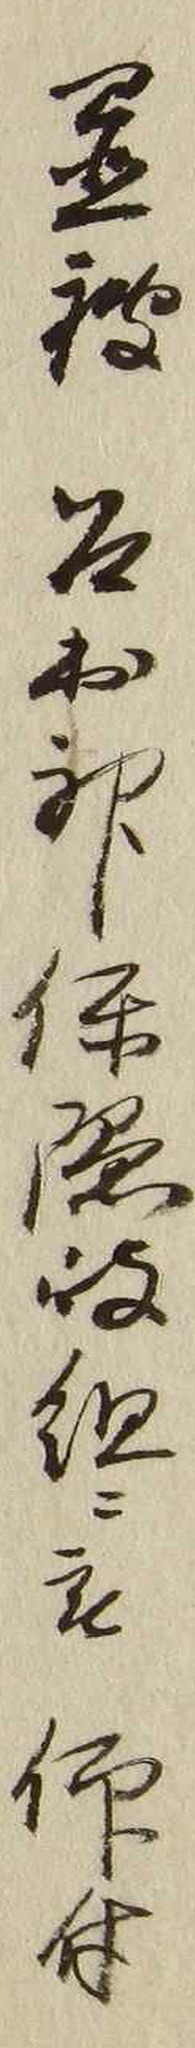置被召出神保隠岐組ニ被仰付
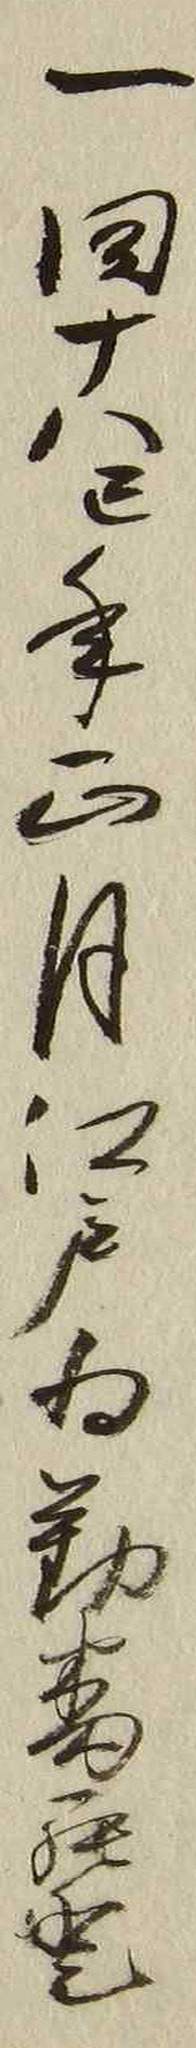一同十八巳年正月江戸為勤番罷登
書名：諸士系譜　巻之356　す之部6
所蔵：会津若松市立会津図書館
